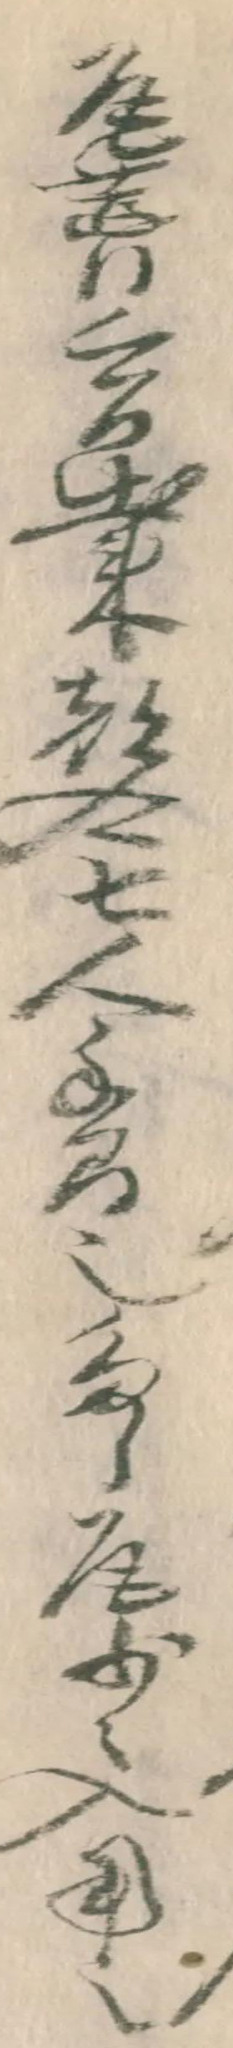屋葺今日出来都合七人手間也たし瓦少々入用也
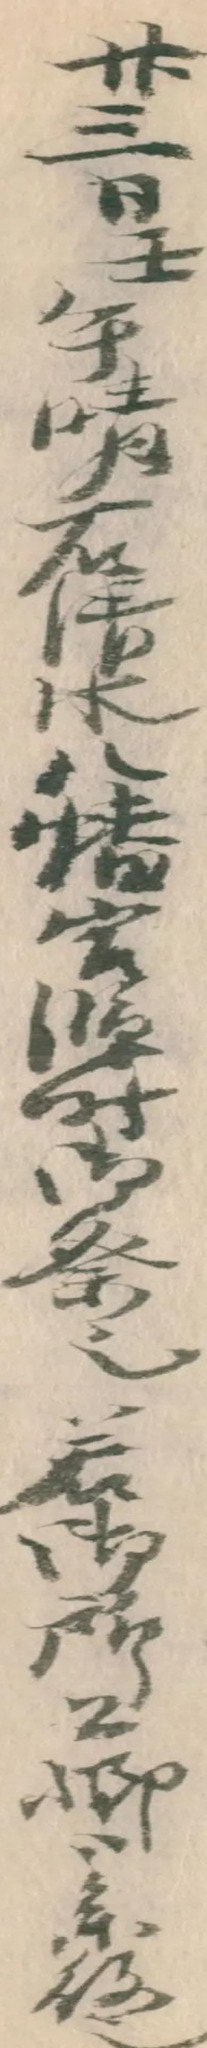廿三日壬午晴右清水八幡宮臨時御祭也若御所公卿御参詣也
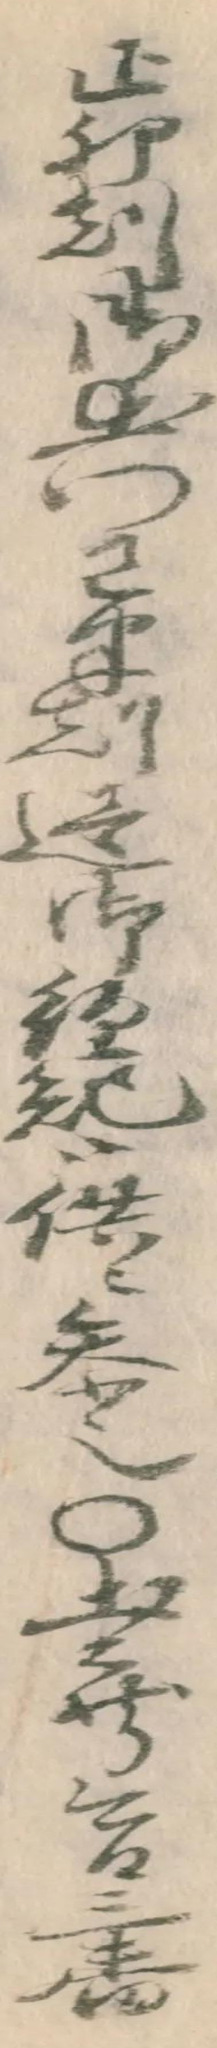正卯刻御出門巳半刻還御経紀御供ニ参也〇土蔵今日三番
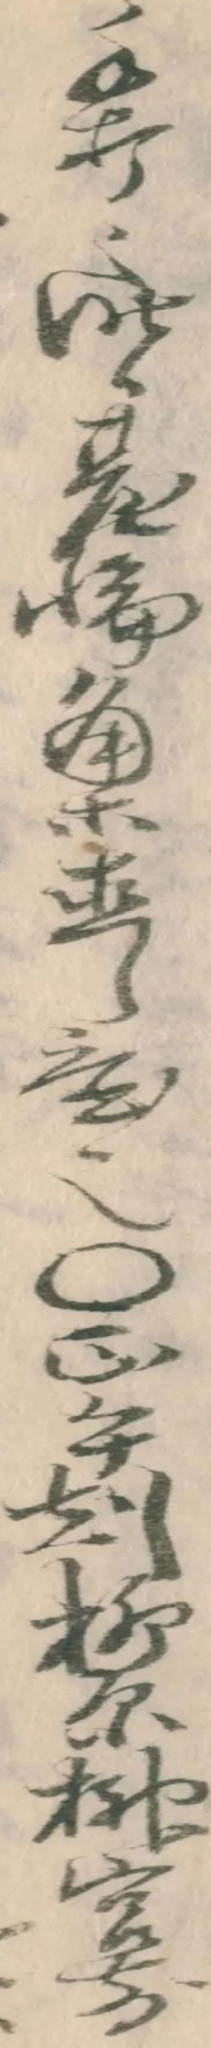手打也昨日臺輪角等直し置也〇正午刻柳原榊宮前
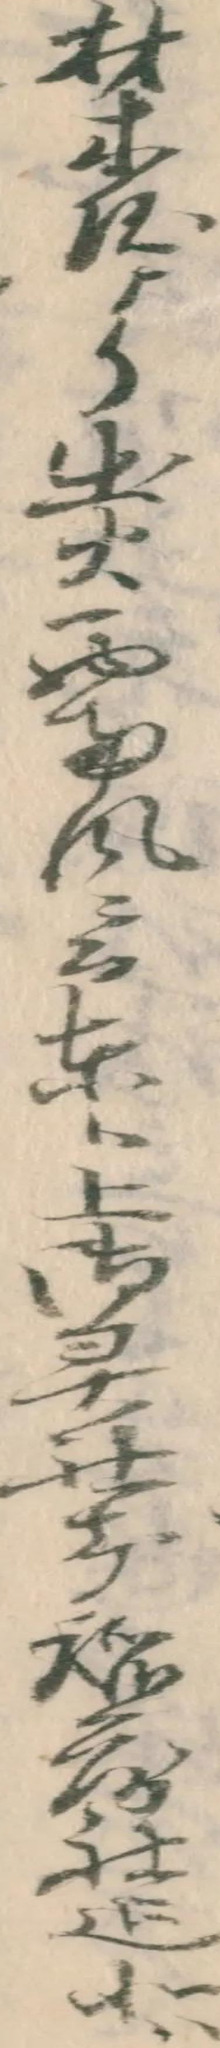材木屋より出火西南風ニ而東ハ上御霊社より稲荷社迄北ハ
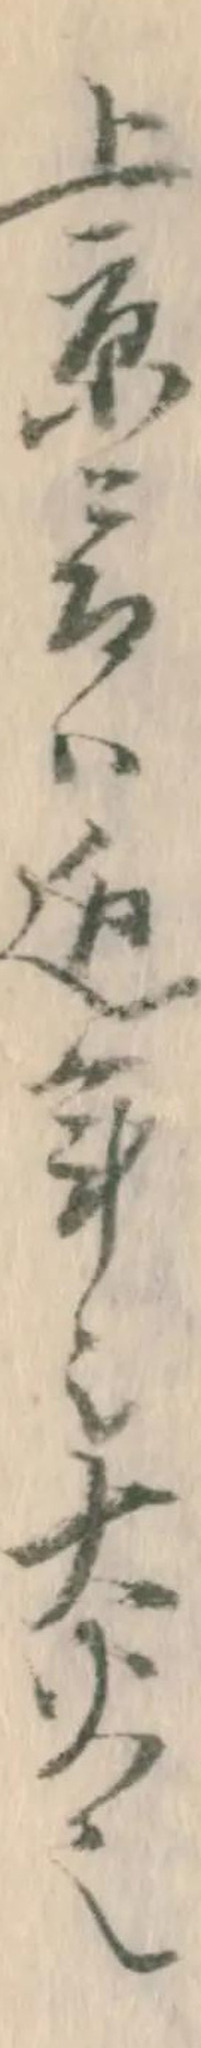上京ニ而は近年之大火也
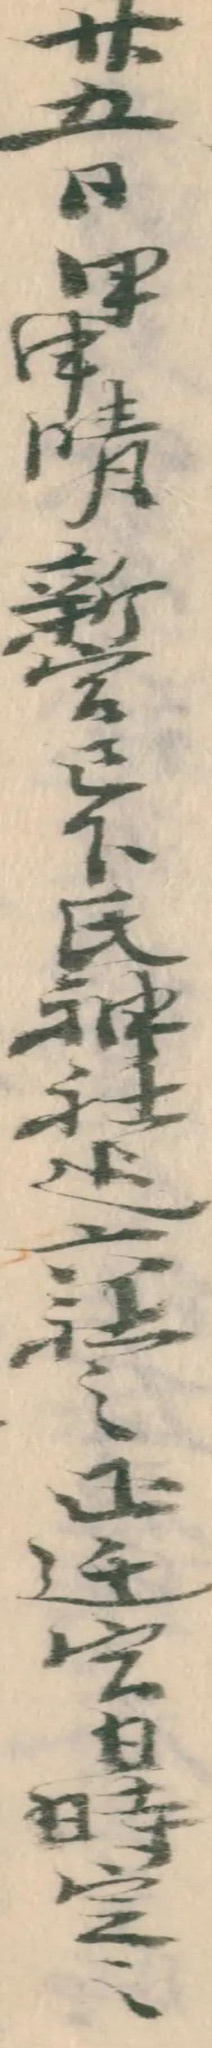廿五日甲申晴新宮已下氏神社迄六社之正遷宮日時定之
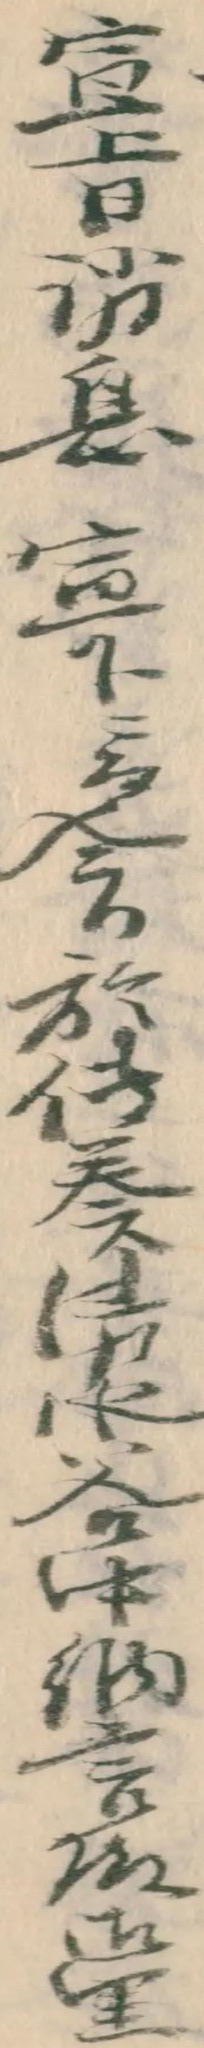宣旨消息宣下ニ而今日於傳奏清水谷中納言殿御里
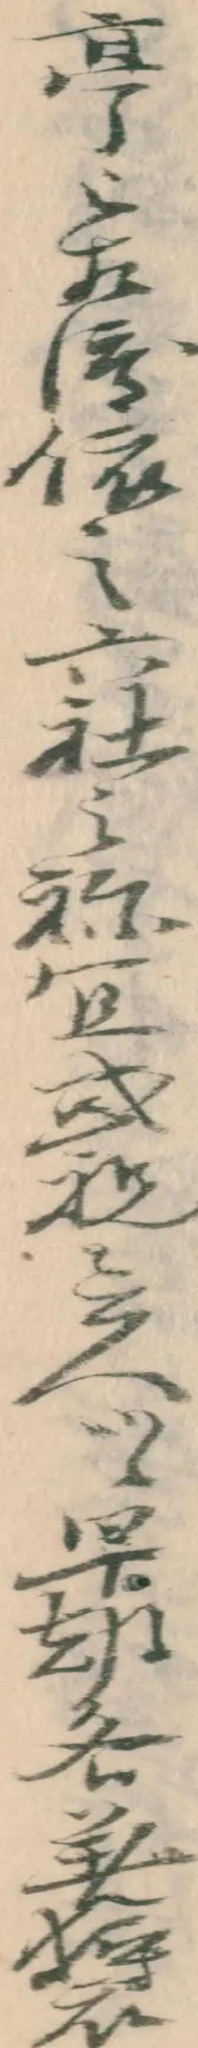亭被相渡依之六社之称宜或祝壱人ツヽ早朝各着狩衣
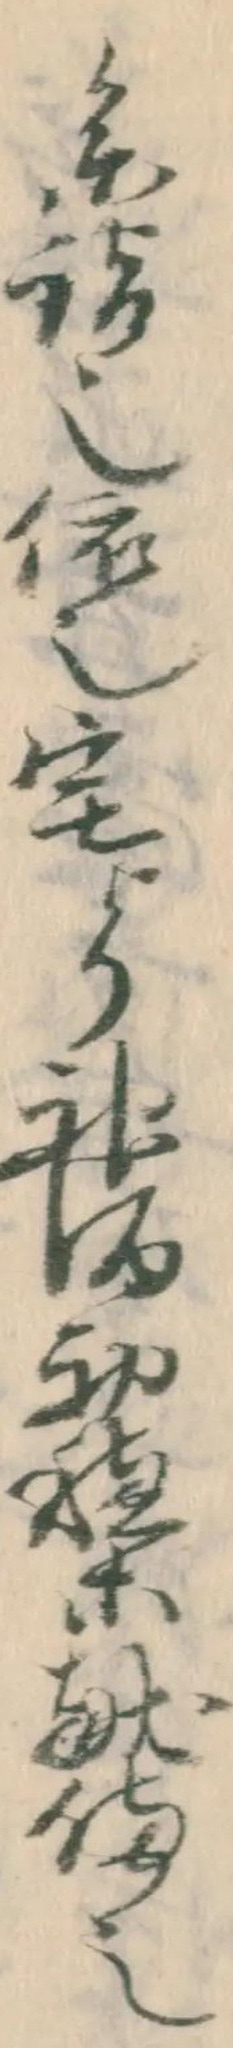参詣也依之宅より神酒初穂等献備也
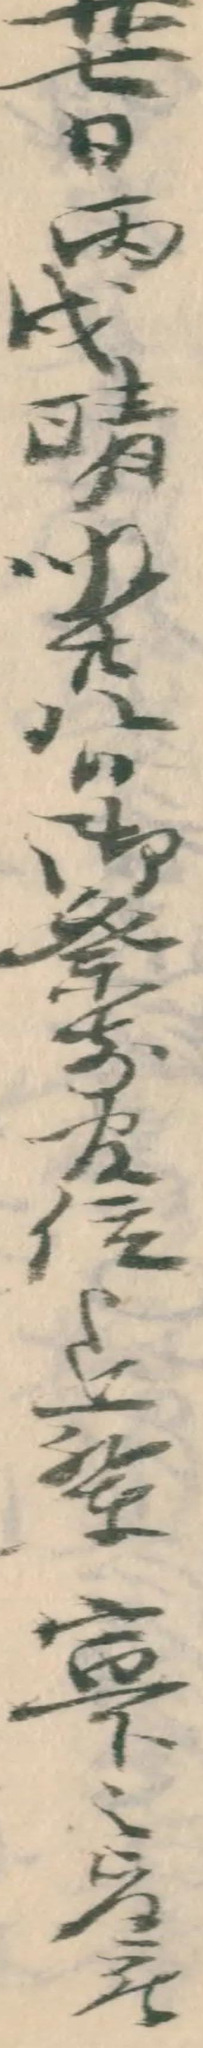廿七日丙戌晴明廿八日御祭前官位申上輩宣下之旨ニ付
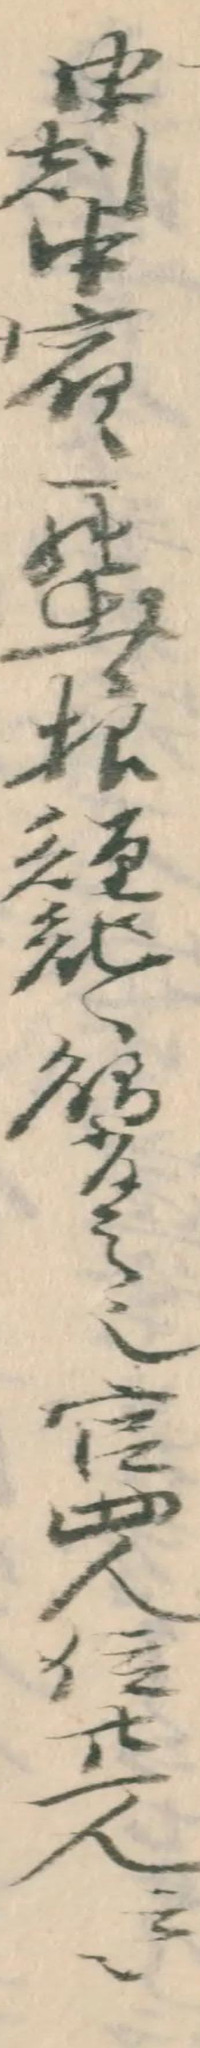申刻中宿へ罷出候様経紀へ觸有之也官四人位廿一人云々
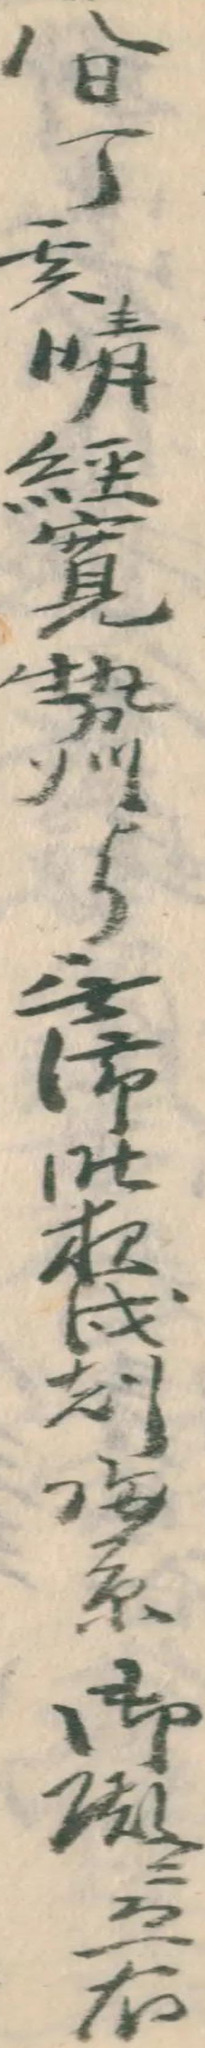廿八日丁亥晴経寛勢州より無滞昨夜戌刻帰京御殿ニ而一宿
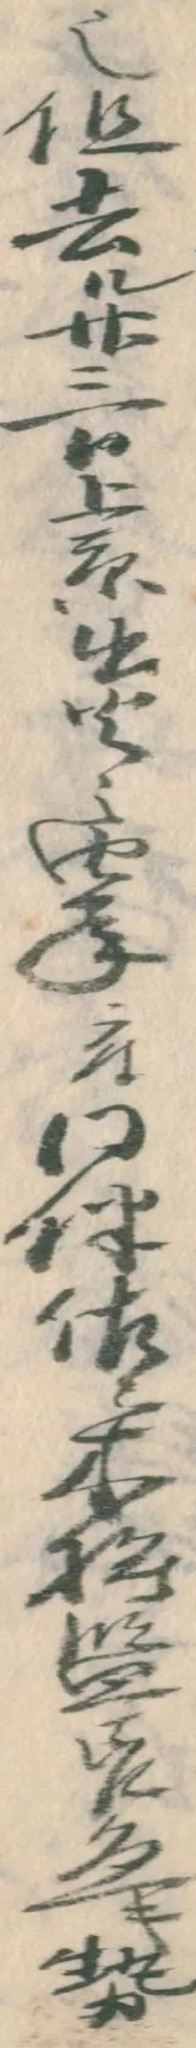也但去ル廿三日上京出火之由年ニ付同伴佐々木将監差キ勢
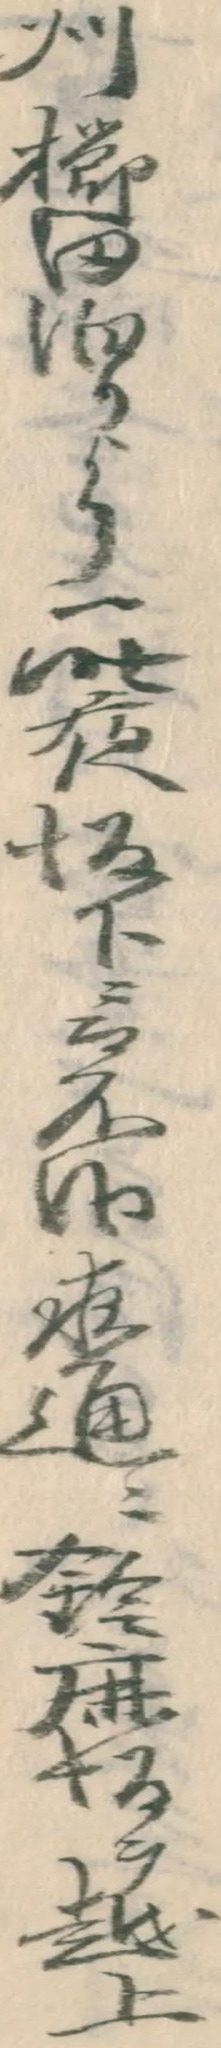州櫛田泊りより一昨夜坂下ニ而不泊夜通ニ鈴鹿坂ヲ越上
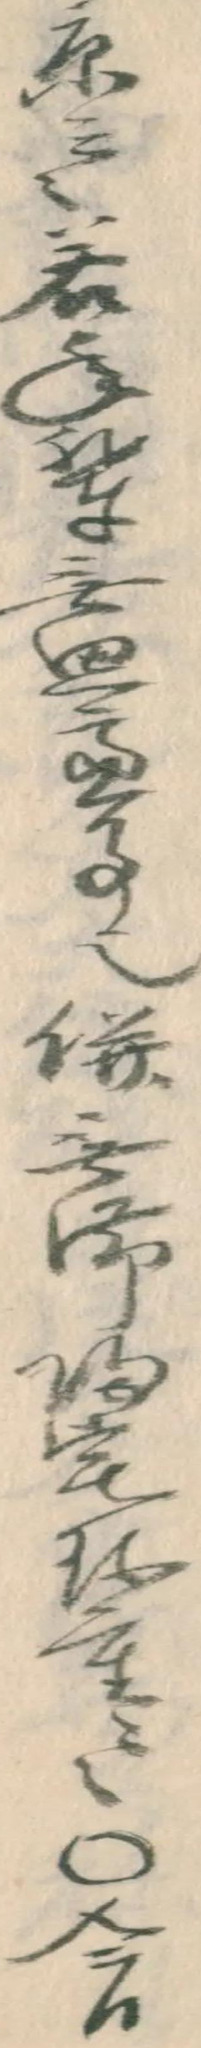京云々若年輩無思慮事也併無滞帰宅致重々々〇今日
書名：賀茂社記録. 第67冊
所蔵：国立国会図書館 National Diet Library, JAPAN
